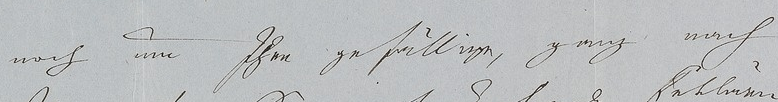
noch um Ihre gefällige, ganz nach
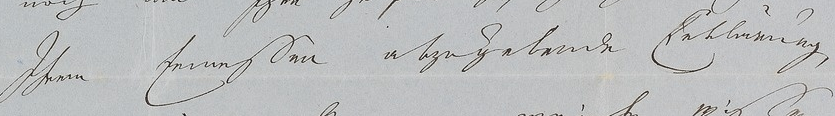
Ihrem Ermessen abzugebende Erklärung.
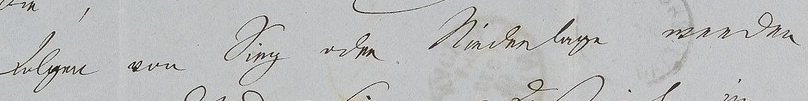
Folgen von Sieg oder Niederlage werden
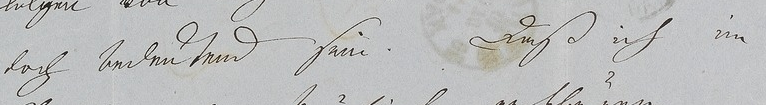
doch bedeutend sein. Daß ich im
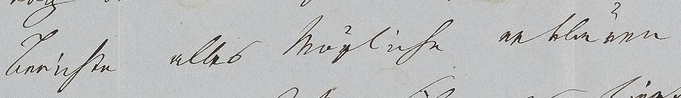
Berichte alles Mögliche erklären
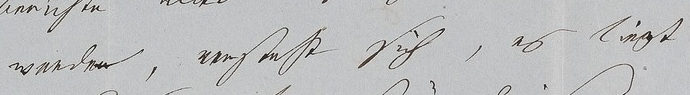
werden, versteht sich, es liegt
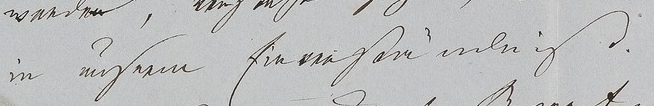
in unserm Einverständniß.
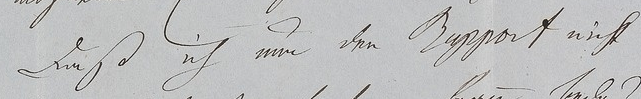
Daß ich nun den Rapport nicht
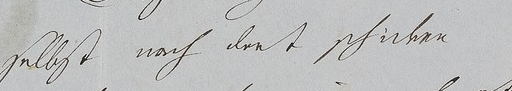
selbst nach dort schicken
